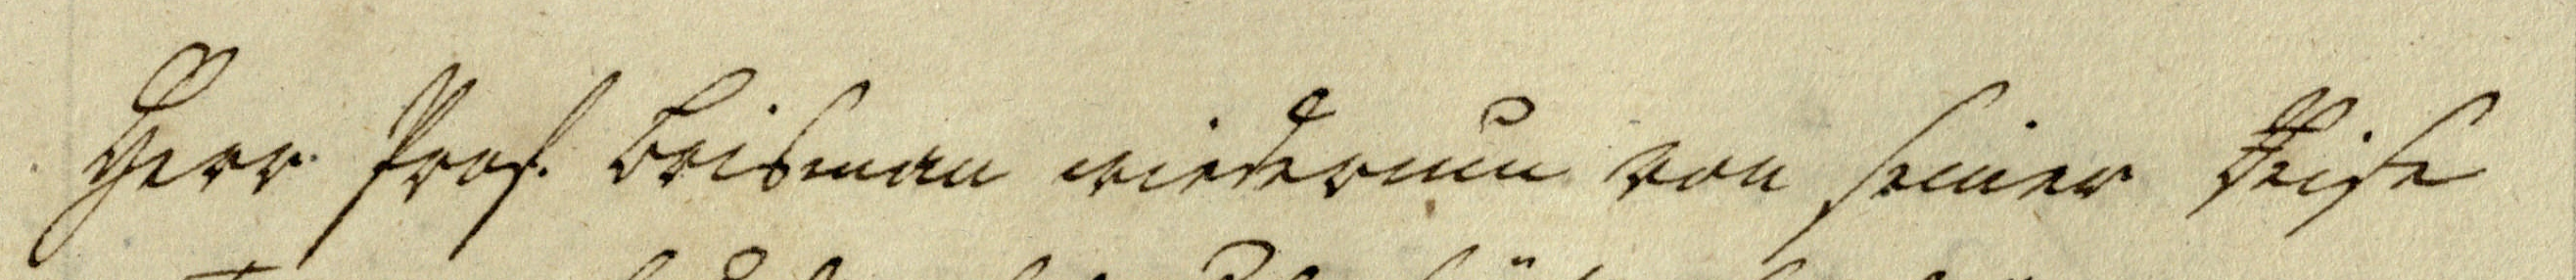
Herr Prof. Brisman wiederum von seiner Reise
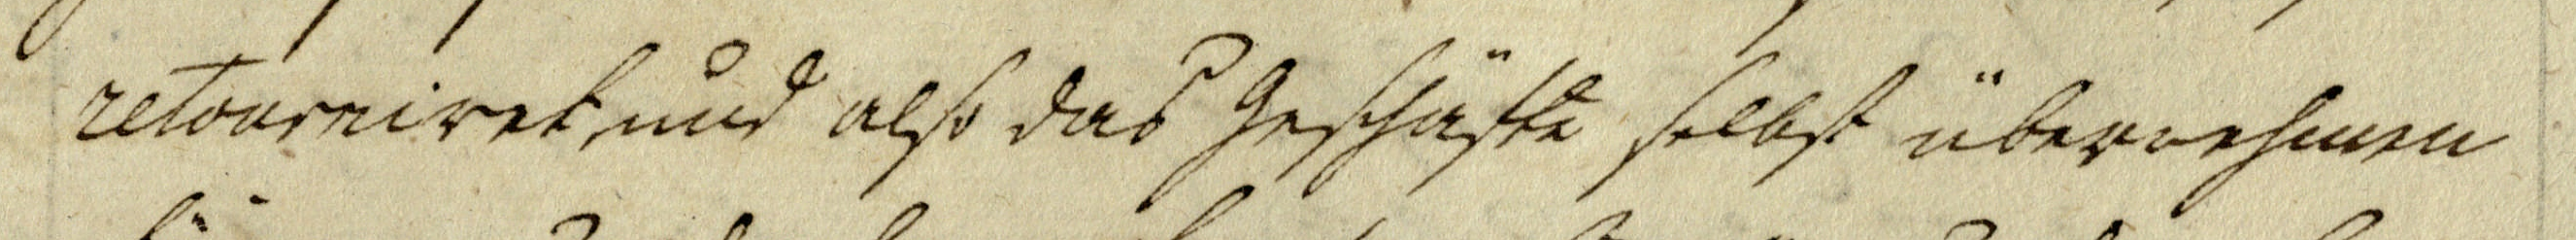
retourniret und also das Geschäfte selbst übernehmen
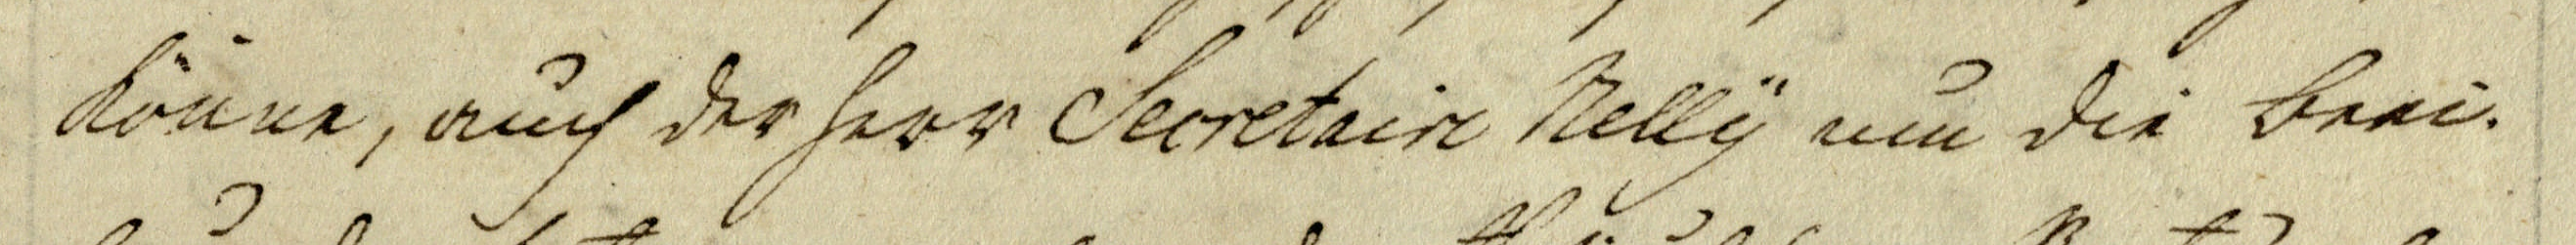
könne, auch der Herr Secretaire Nellÿ um die Beei¬
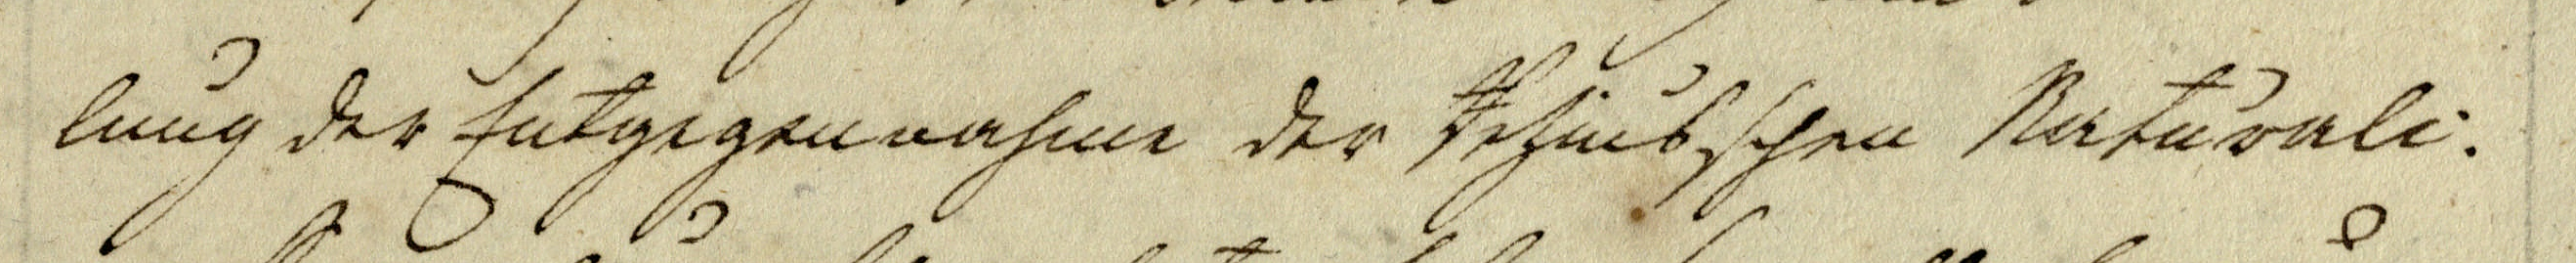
lung der Entgegennahme der Reziusschen Naturali¬
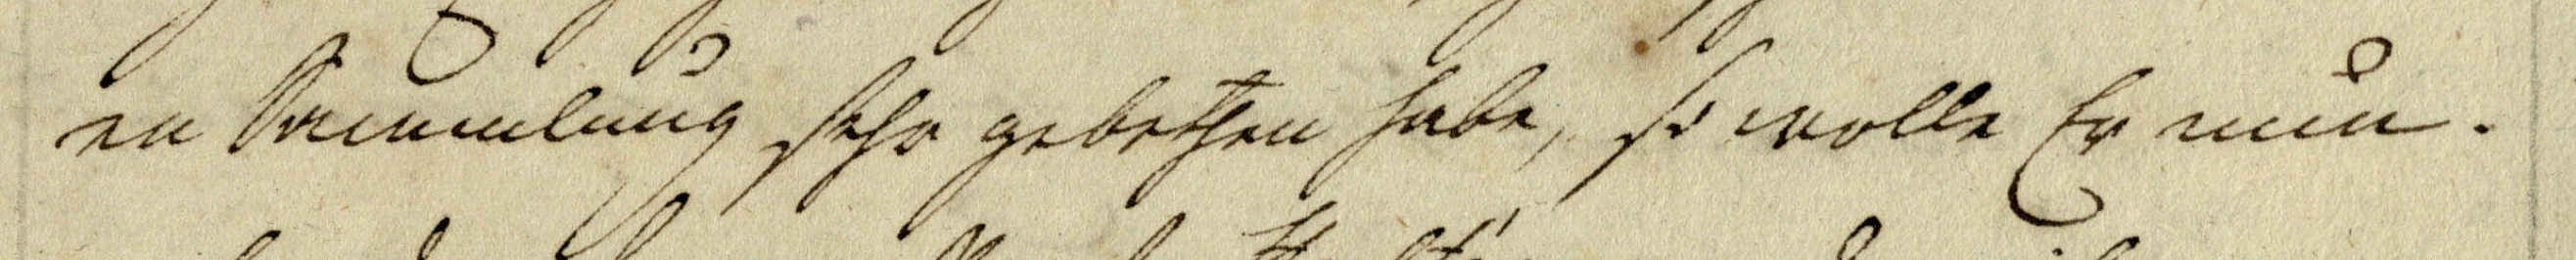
en Sammlung sehr gebethen habe, so wolle Er nun¬
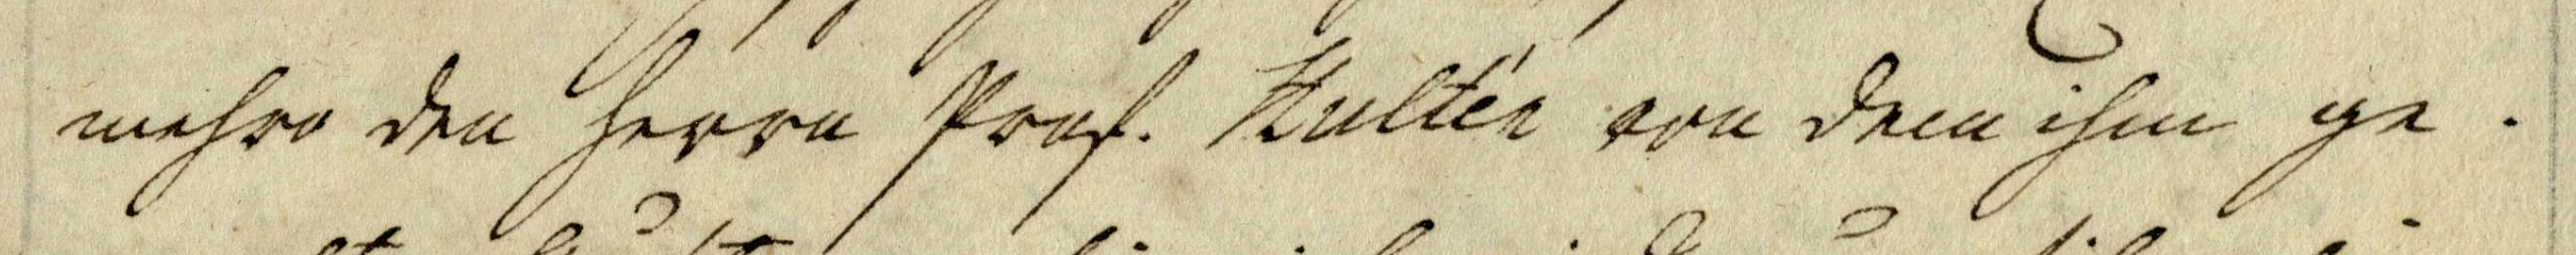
mehr den Herrn Prof. Hultén von dem ihm ge¬
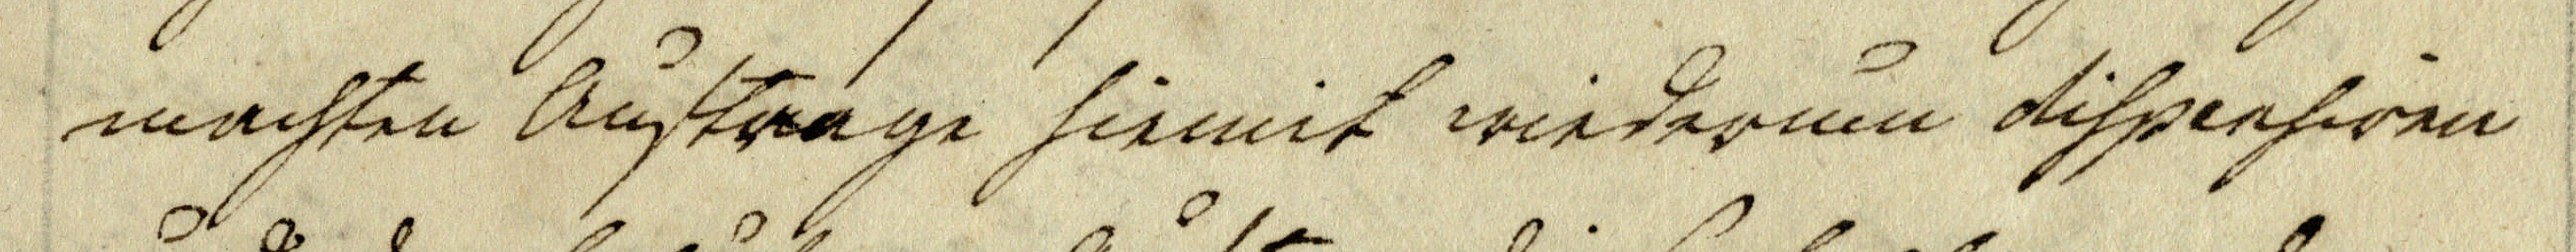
machten Auftrage hiemit wiederum dispensiren
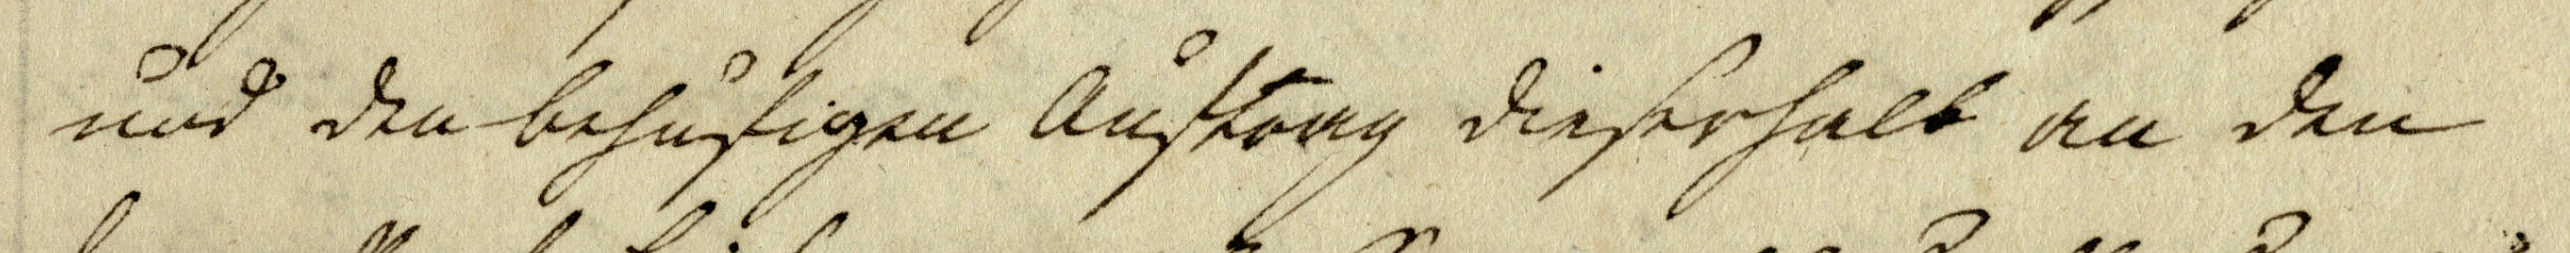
und den behufigen Auftrag dieserhalb an den
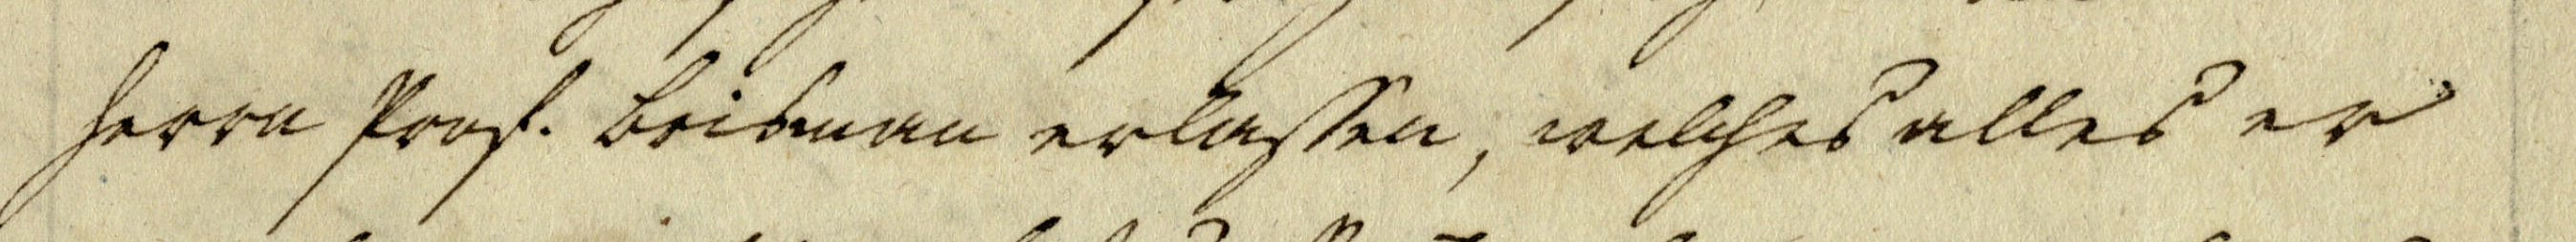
Herrn Prof. Brisman erlassen, welches alles er
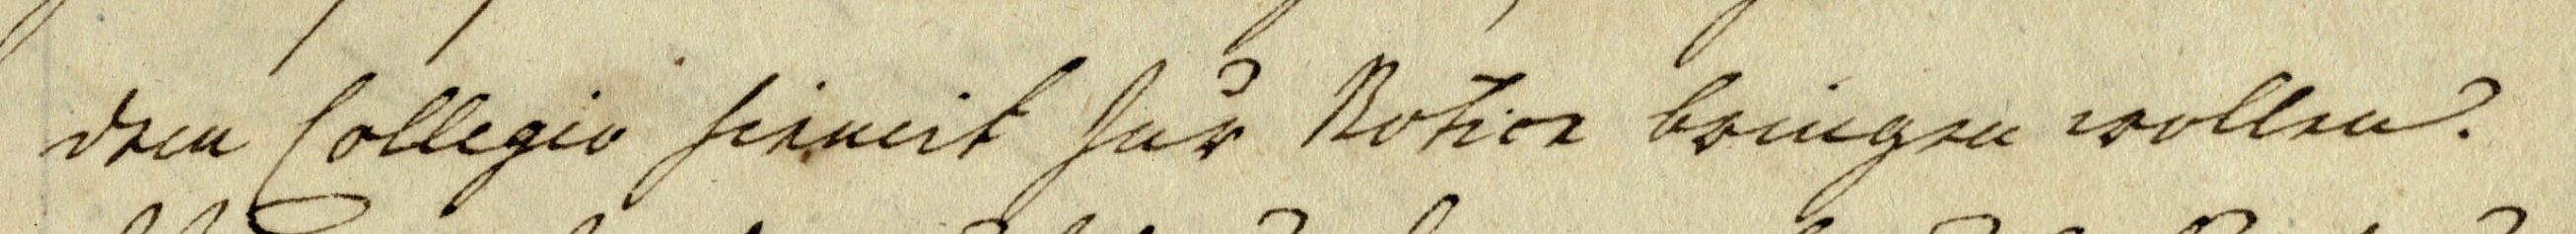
dem Collegio hiemit zur Notice bringen wollen.
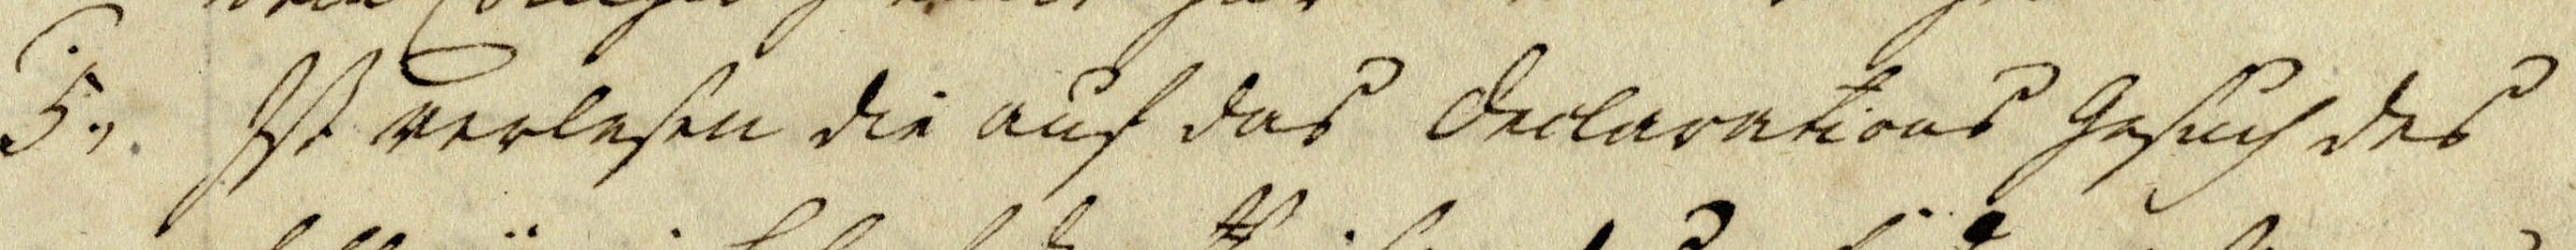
5., Ist verlesen die auf das Declarations Gesuch des
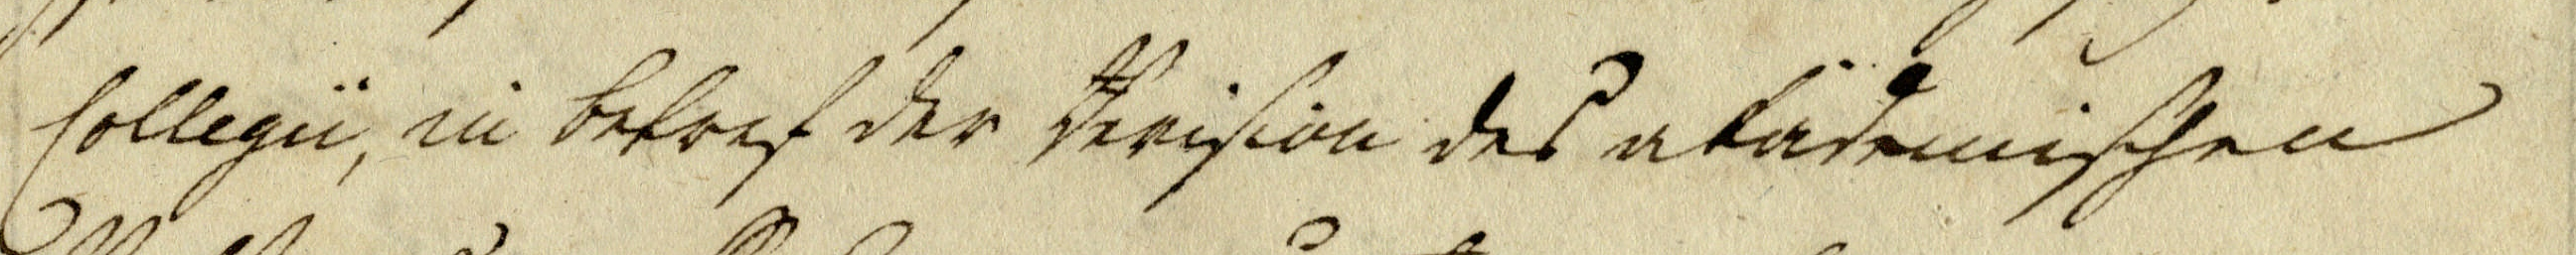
Collegii, in Betref der Revision des akademischen
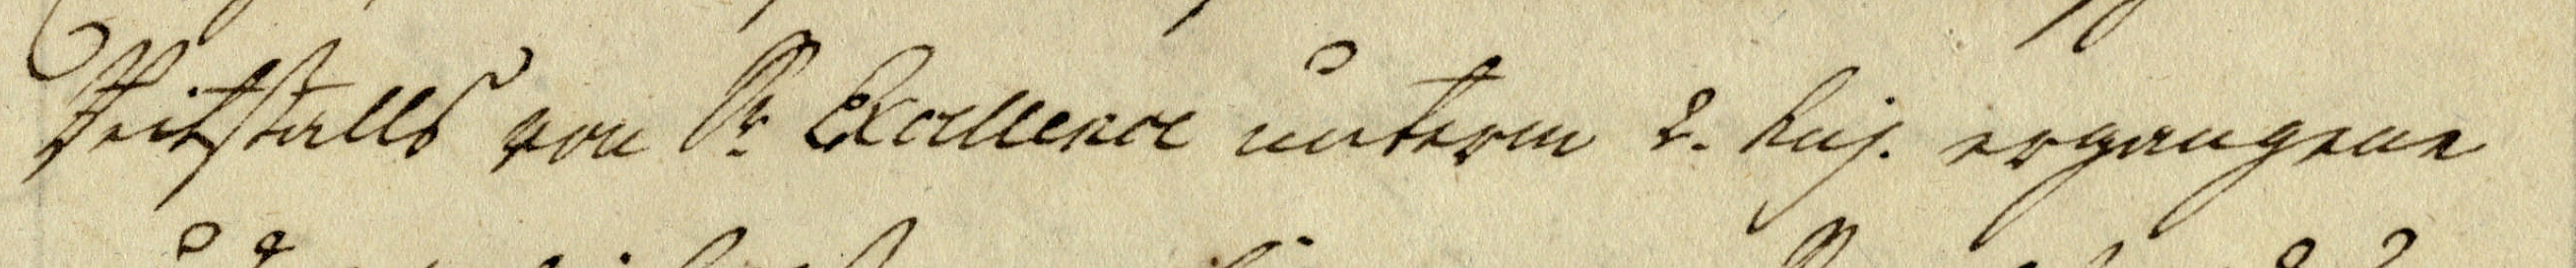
Reitstalls von Sr Excellence unterm 2. huj. ergangene
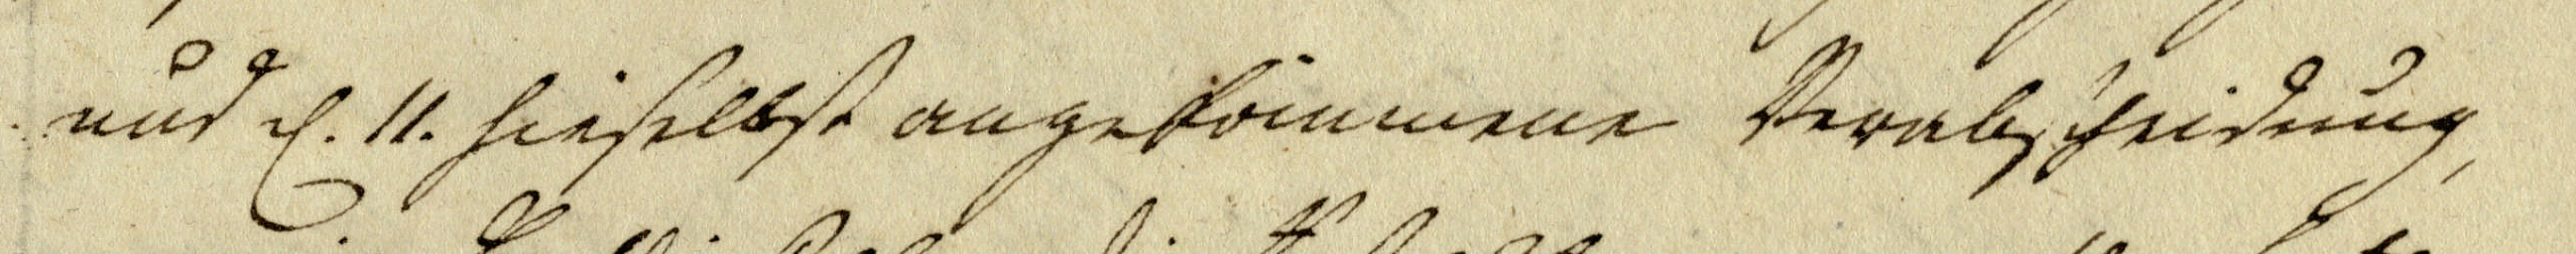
und d. 11. hieselbst angekommene Verabscheidung
